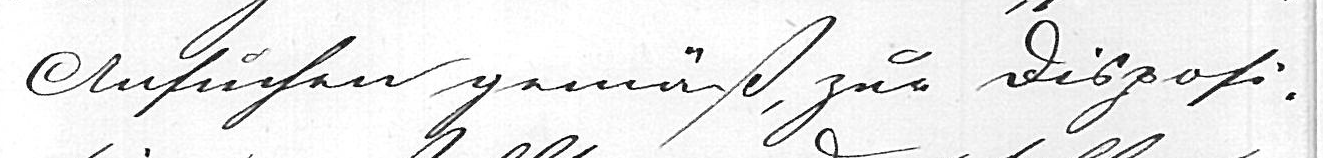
Ansuchen gemäß, zur Disposi
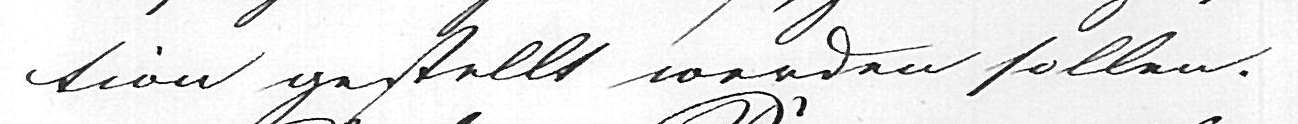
tion gestellt werden sollen.
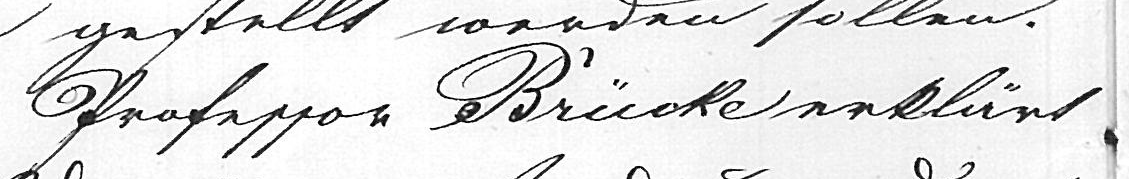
Professor Brücke erklärt
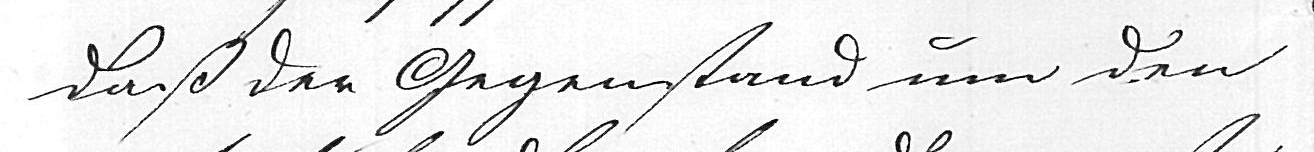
daß der Gegenstand um den
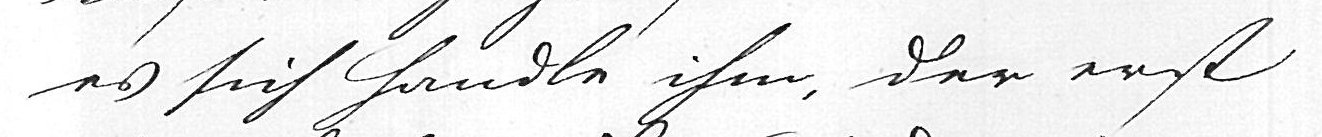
es sich handle ihm, der erst
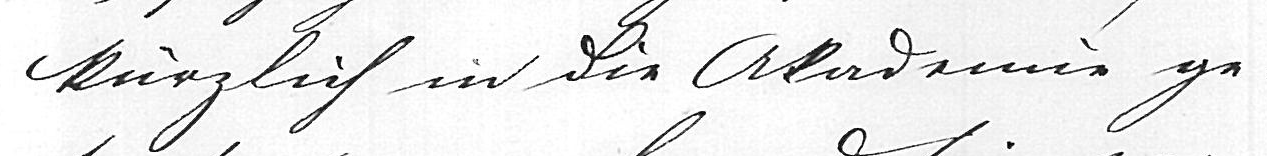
kürzlich in die Akademie ge-
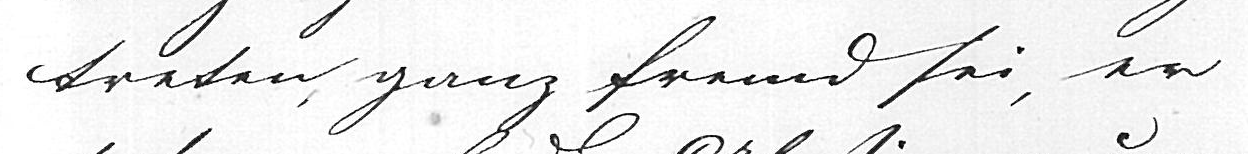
treten, ganz fremd sei, er
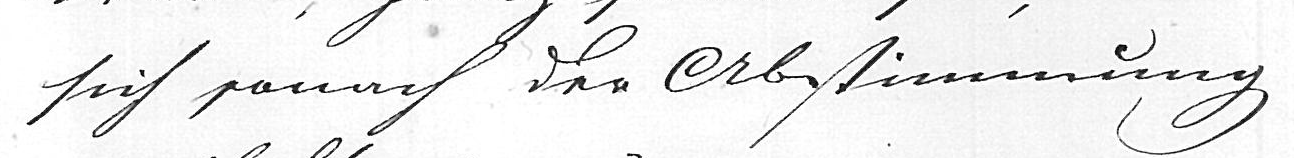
sich sonach der Abstimmung
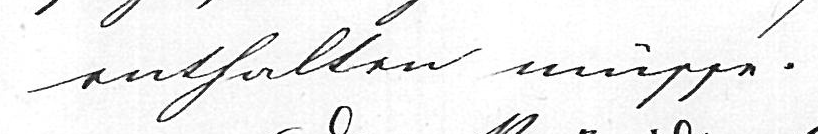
enthalten müsse.
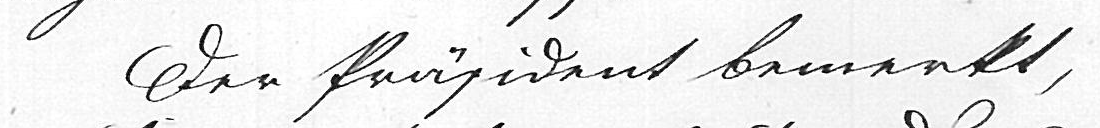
Der Präsident bemerkt,
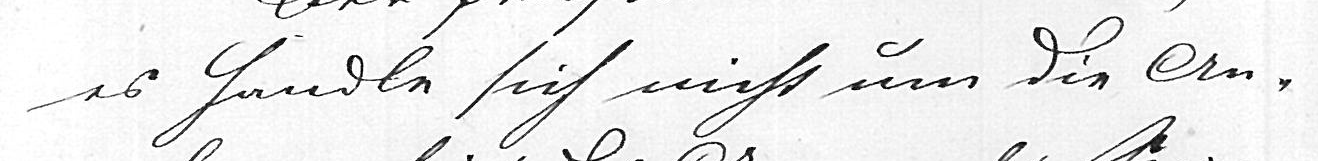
es handle sich nicht um die An-
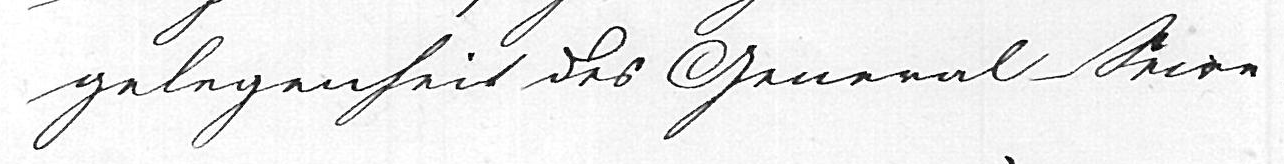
gelegenheit des General-Secre-
